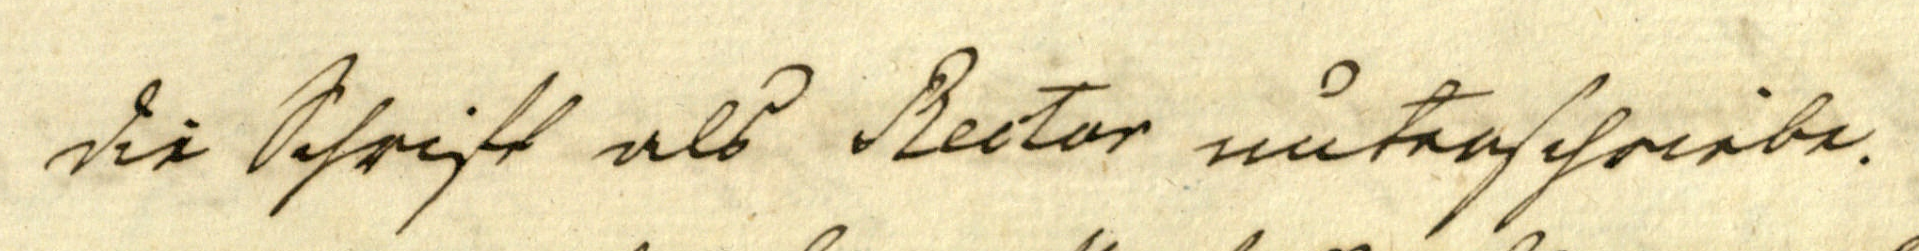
die Schrift als Rector unterschriebe.
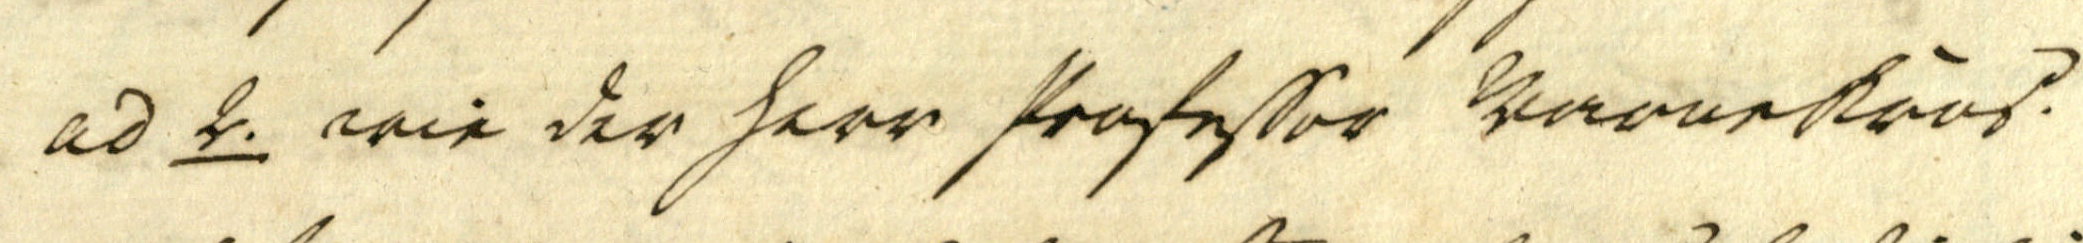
ad 2. wie der Herr Professor Warnekros.
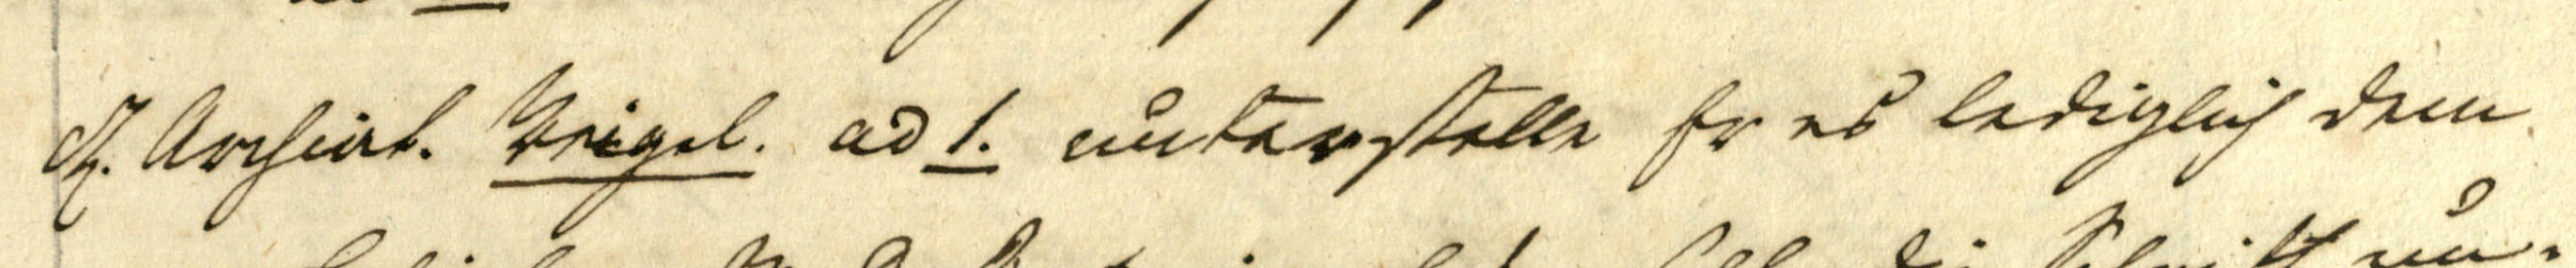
dh. Archiat. Weigel. ad 1. unterstelle Er es lediglich dem
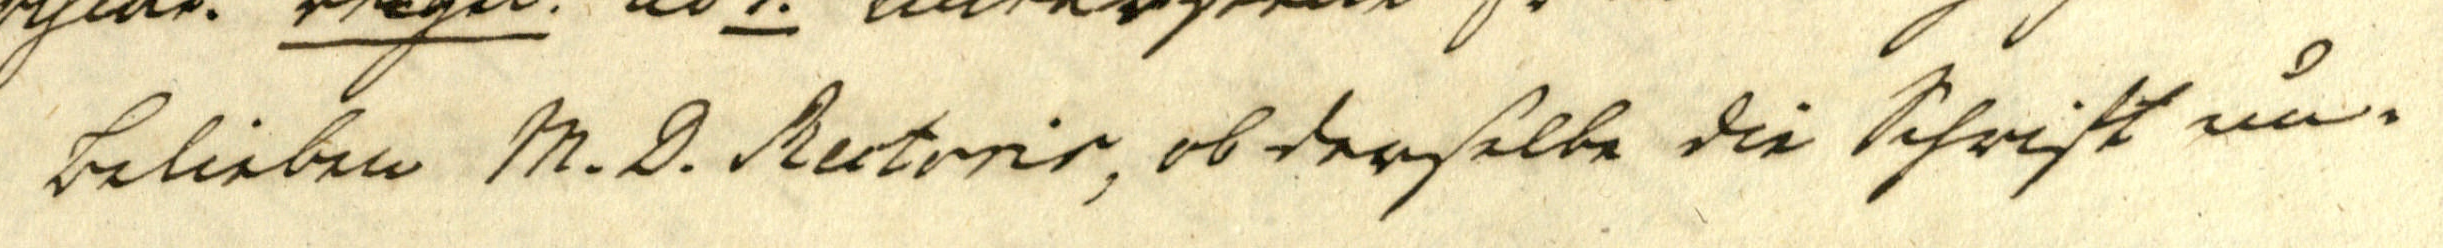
Belieben M. D. Rectoris, ob derselbe die Schrift un¬
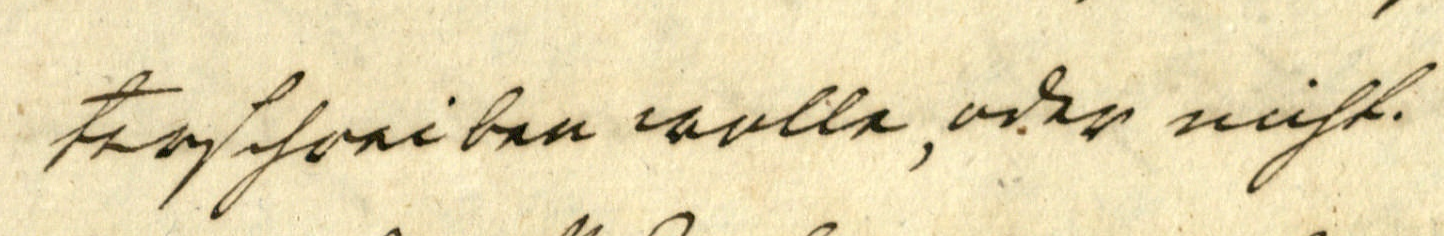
terschreiben wolle, oder nicht.
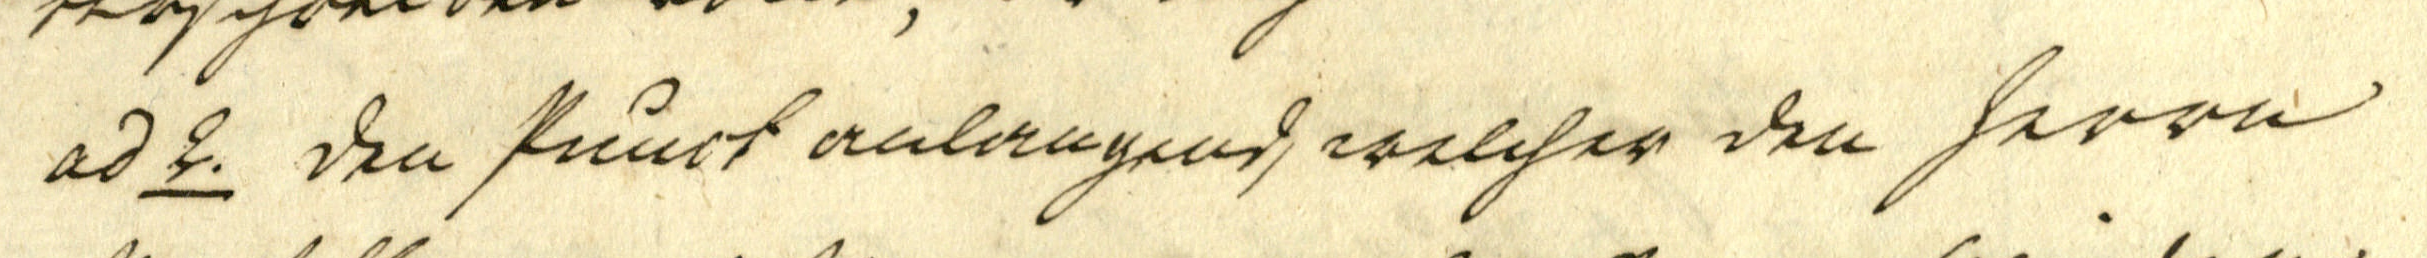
ad 2., den Punct anlangend, welcher den Herrn
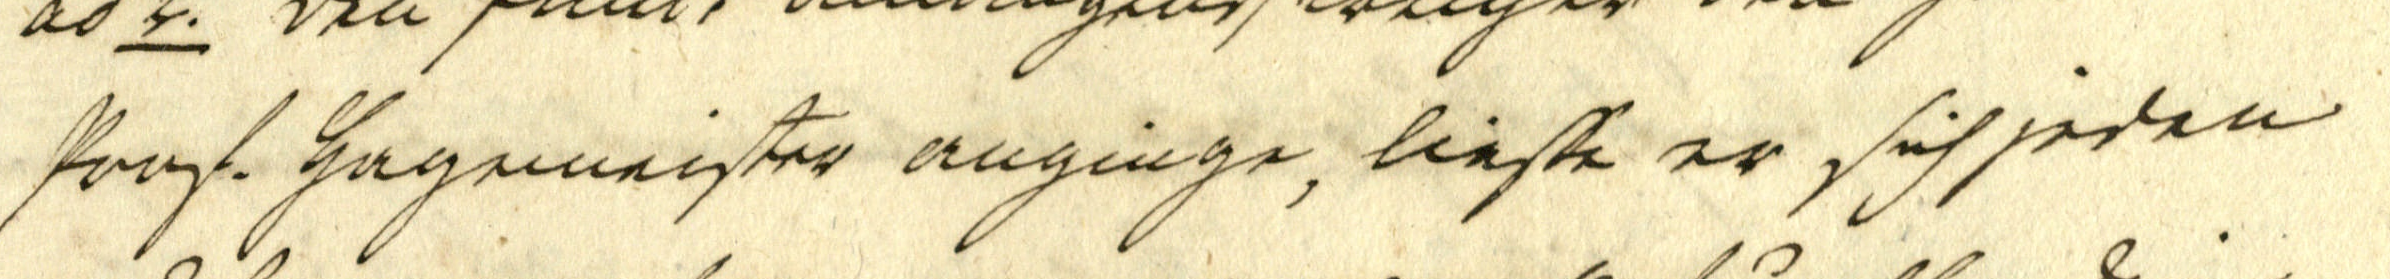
Prof. Hagemeister anginge, liesse er sich jeden
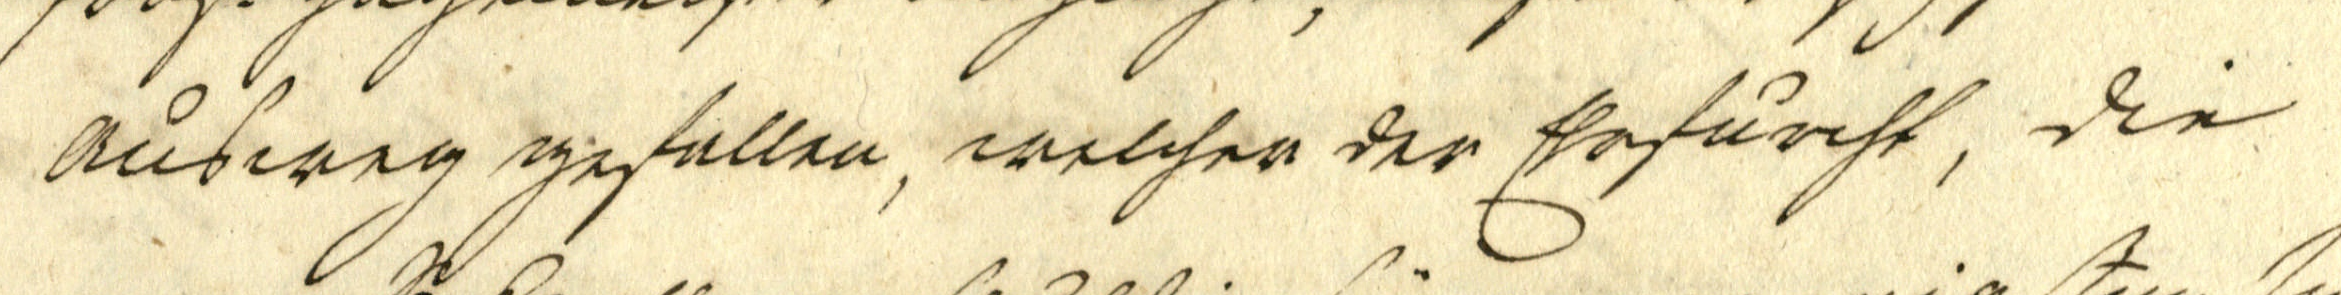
Ausweg gefallen, welcher der Ehrfurcht, die
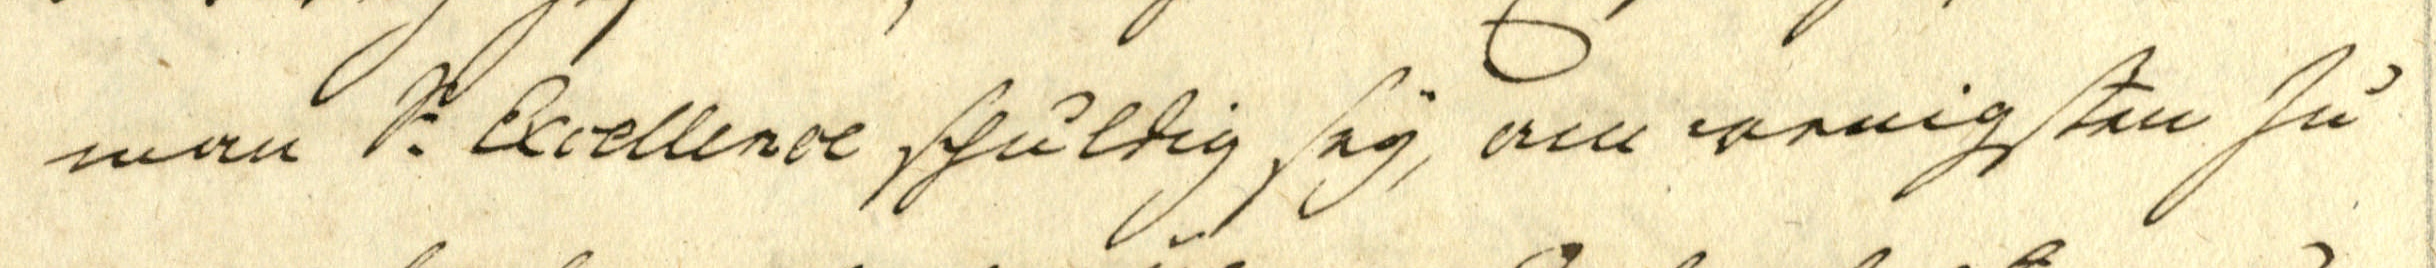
man S. Excellence schuldig seÿ, am wenigsten zu
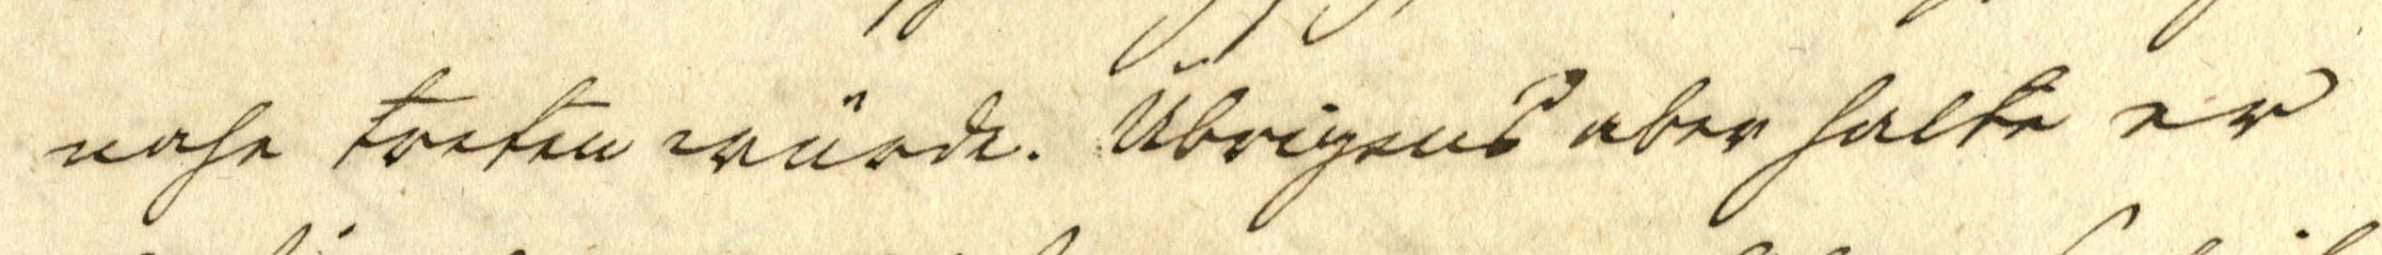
nahe treten würde. Übrigens aber halte er
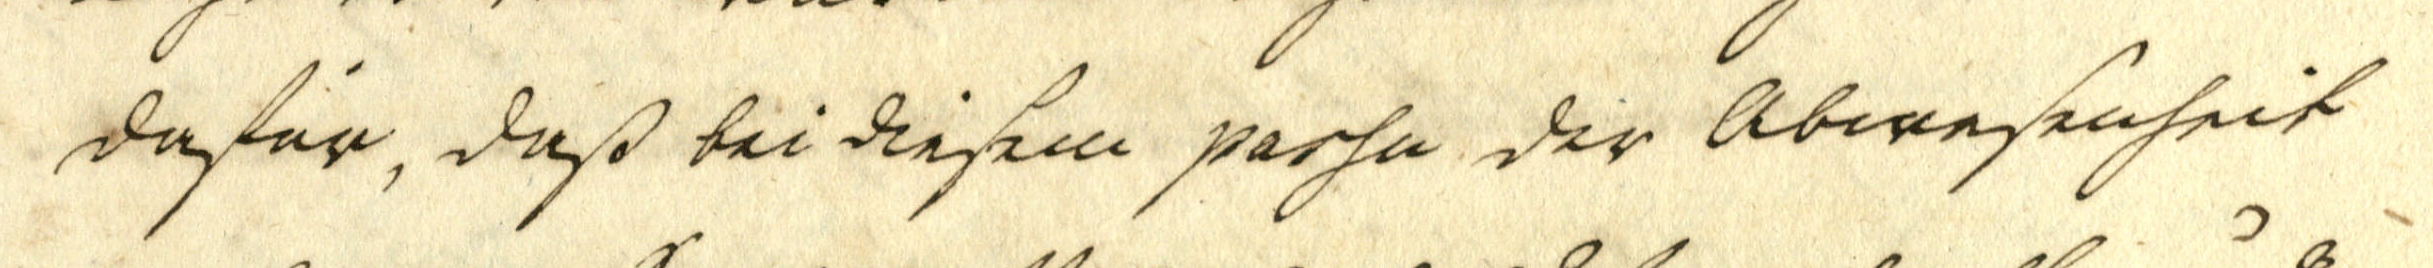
dafür, daß bei diesem passu der Abwesenheit
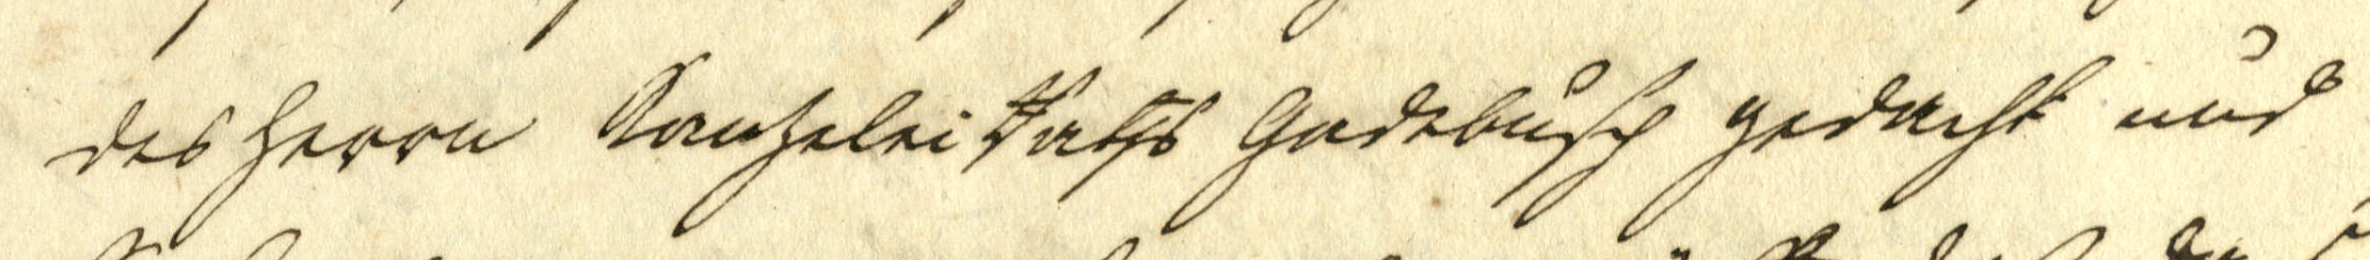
des Herrn Kanzelei Raths Gadebusch gedacht und
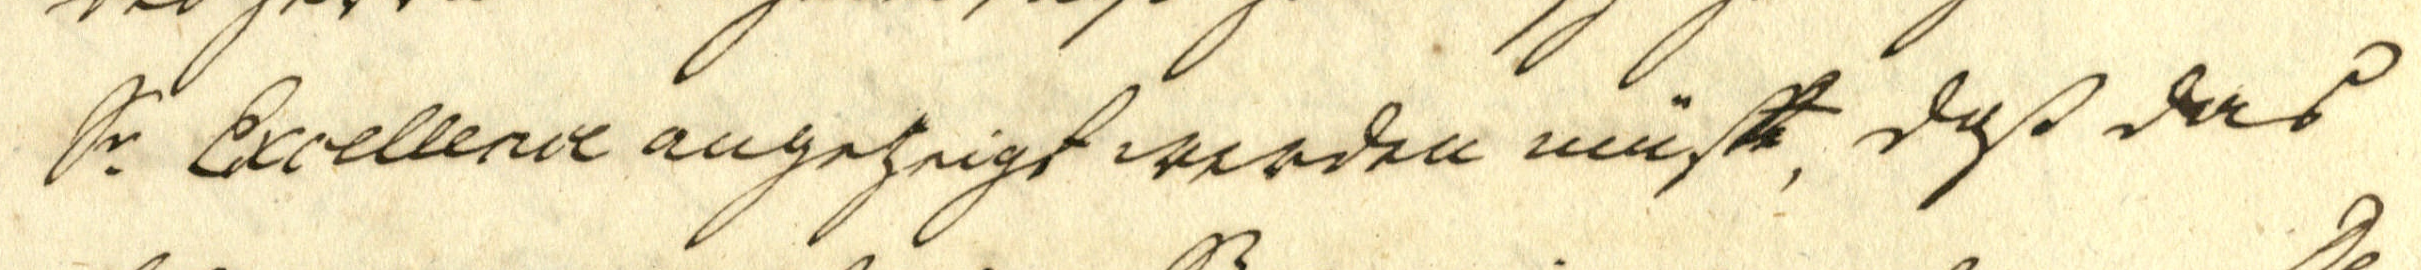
Sr. Excellence angezeigt werden müßte, daß das
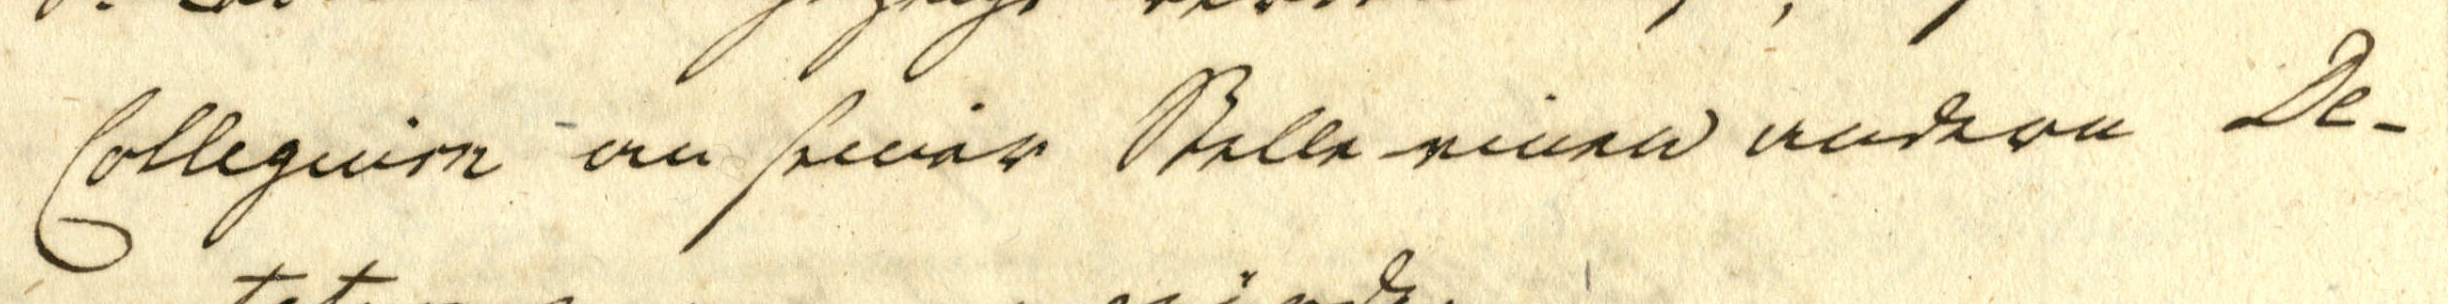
Collegium an seiner Stelle einen andern De¬
